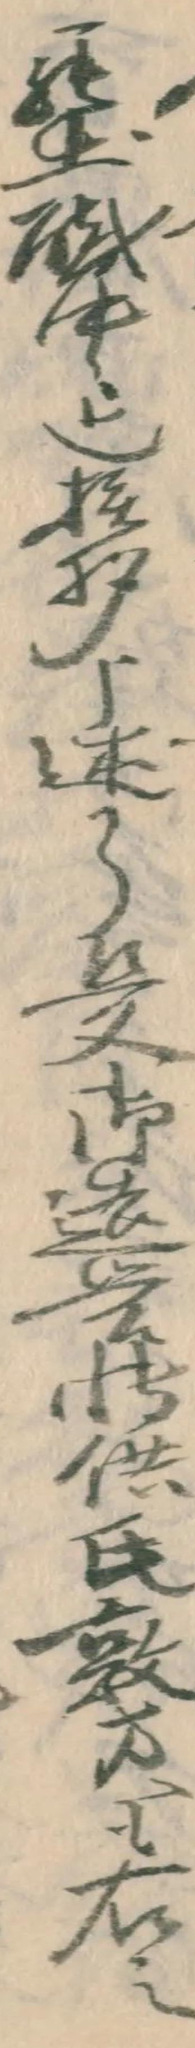罷出職中迄挨拶申述了且又御造営轉供氏敦方へも右之
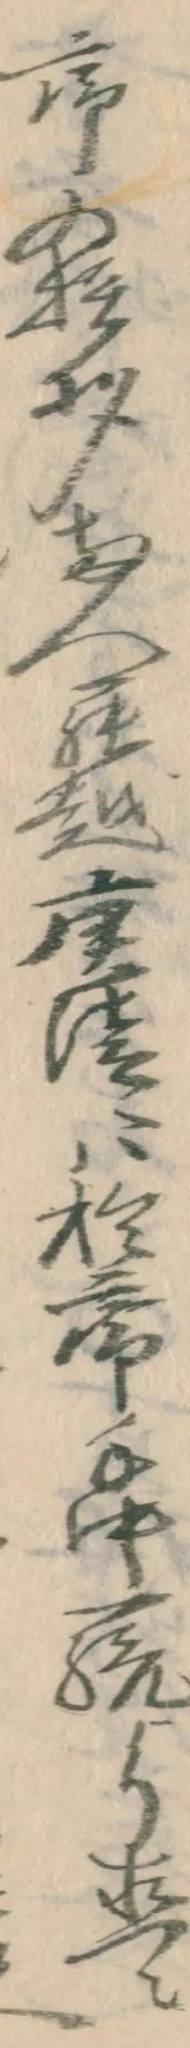序為挨拶両人罷越庚清ヘハ於席手中一統より直に
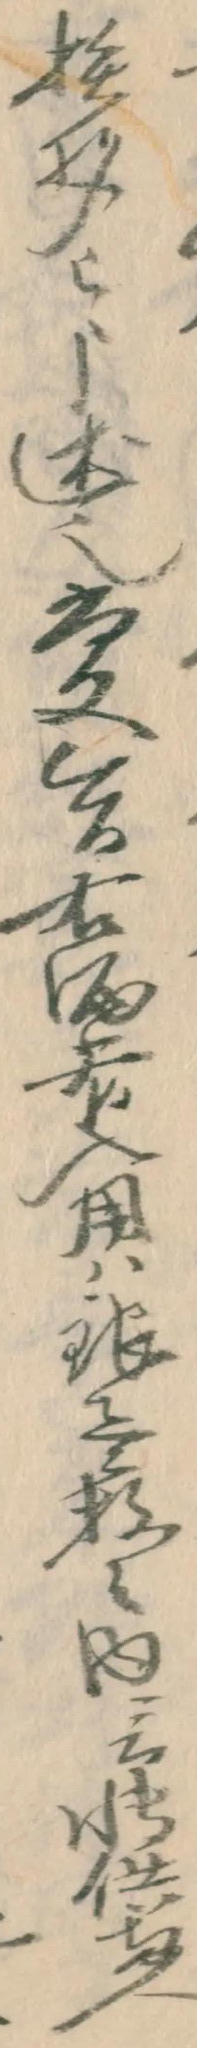挨拶被申述也尚又今日右酒肴入用は銀壱枚之内ニ而轉供両人
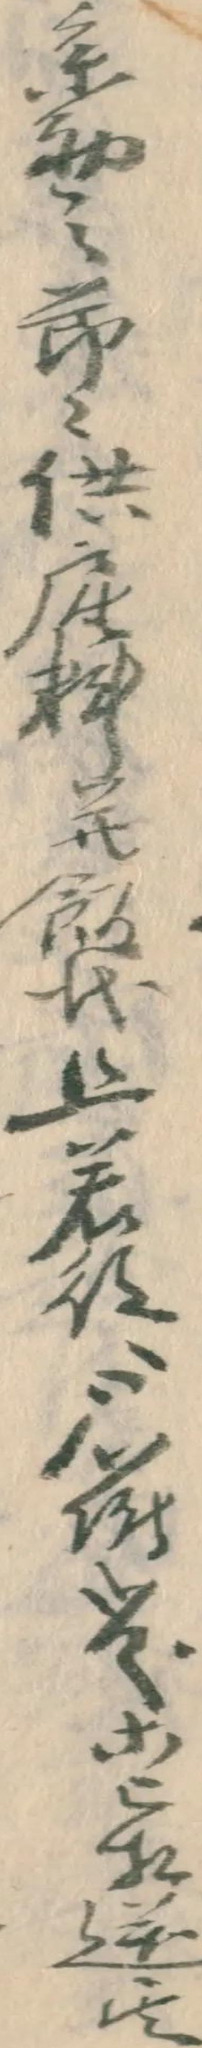参勤之節々供雇料并飯代且若役へ御心附弐匁等被相送其
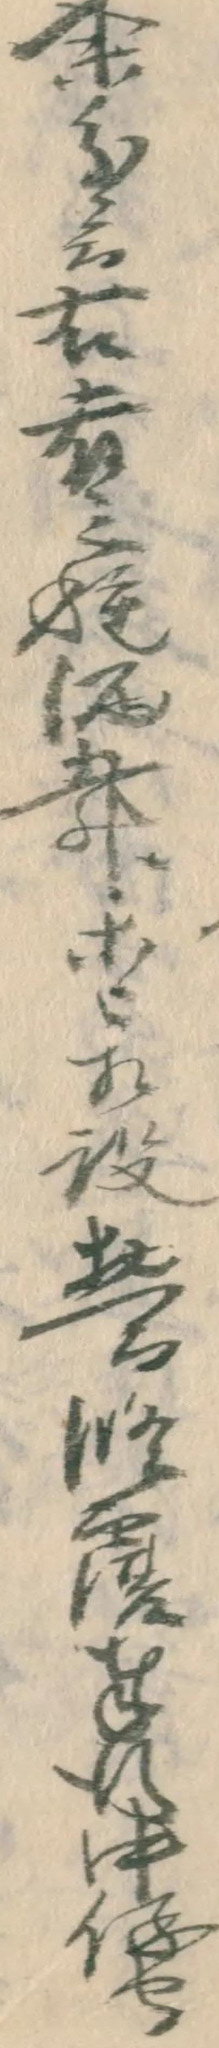余分ニ而右肴之種酒五升等被相設惣而修復奉行中備守
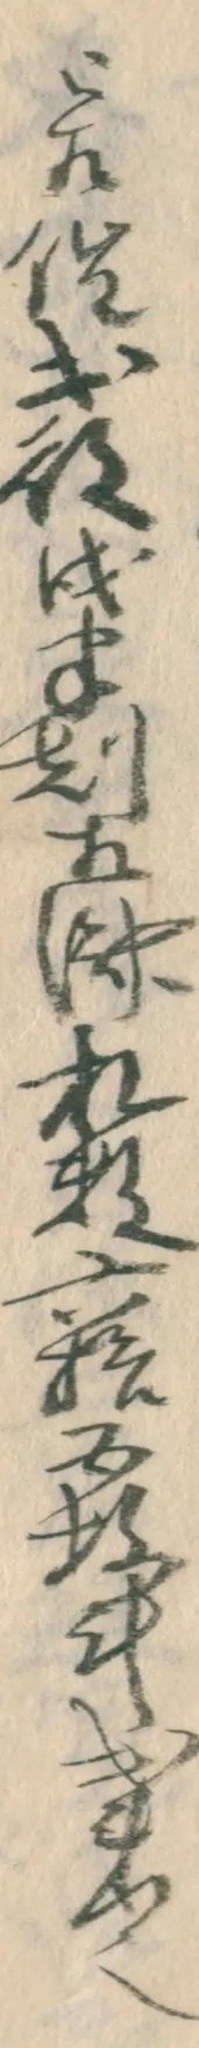被相催出役戌半刻相済札数六拾五枚斗出来也
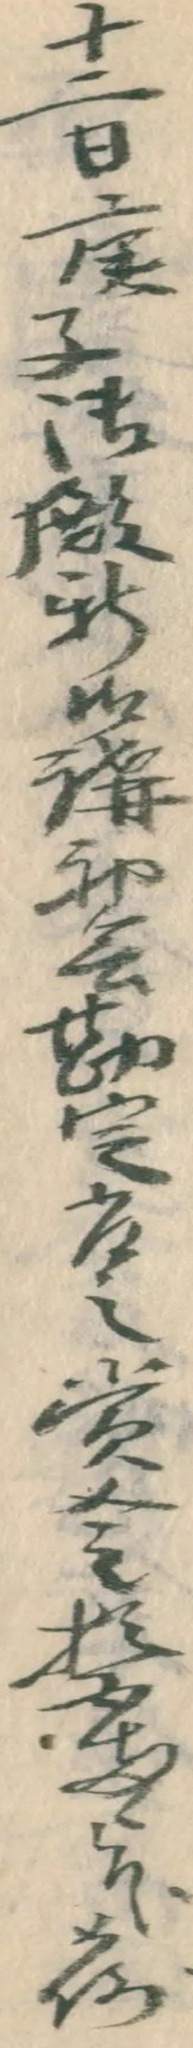十二日庚子御殿新御講初會勘定有之賞金拾五両被下荷
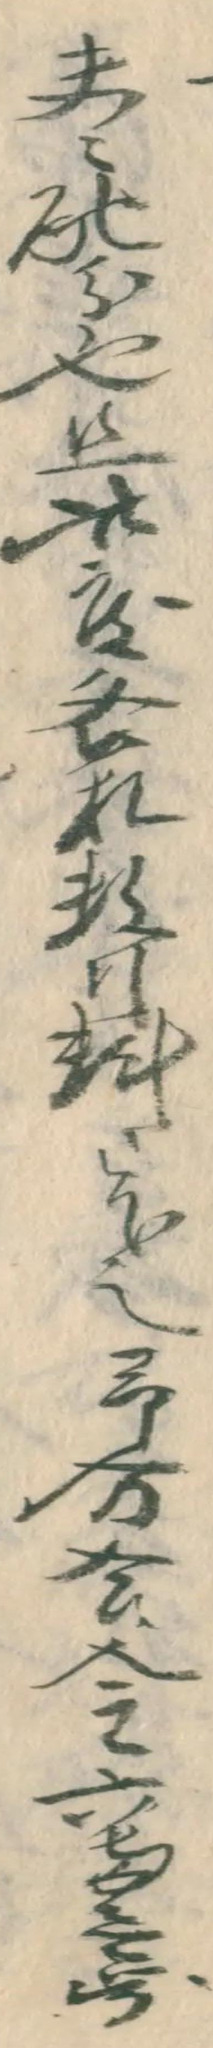夫々配分也且此度各札数引料被下也予分合金六両壱歩
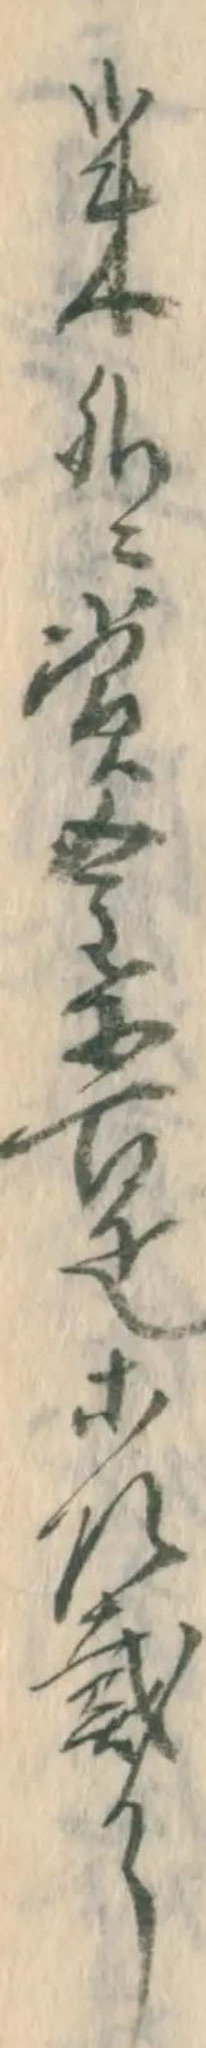弐朱外に賞金五百疋等頂戴了

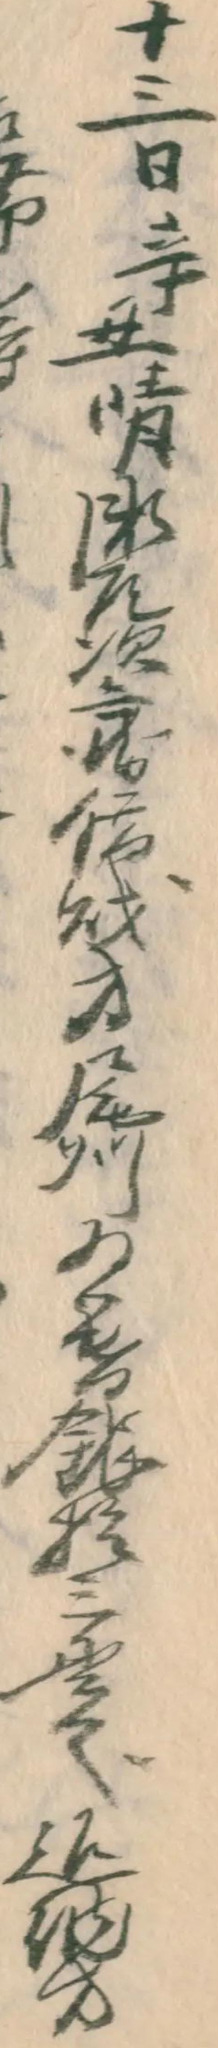十三日辛丑晴瀬屋次郎借財方尾州為暮銀拾三貫匁返納方
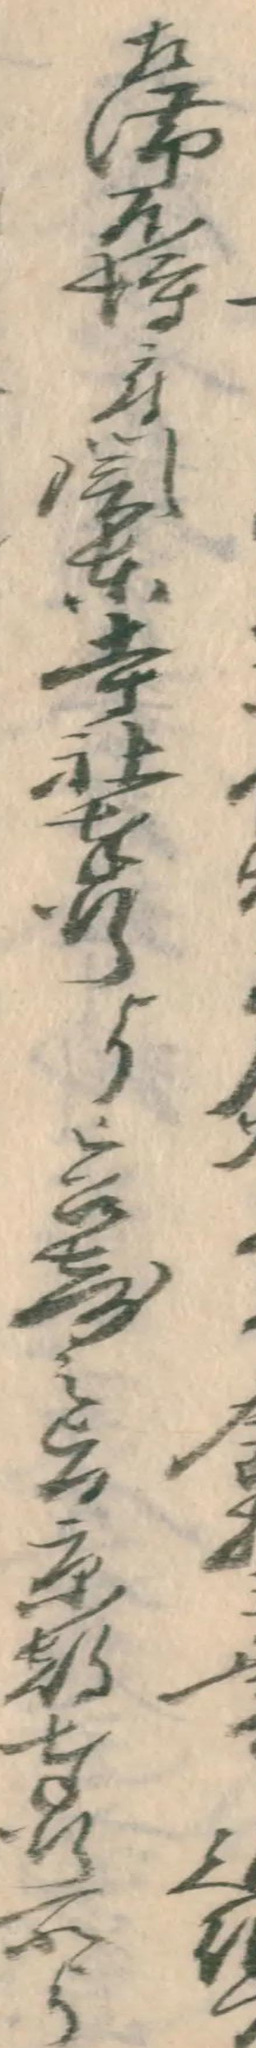相滞不埒ニ付関東寺社奉行より被召寄之旨京都奉行所より
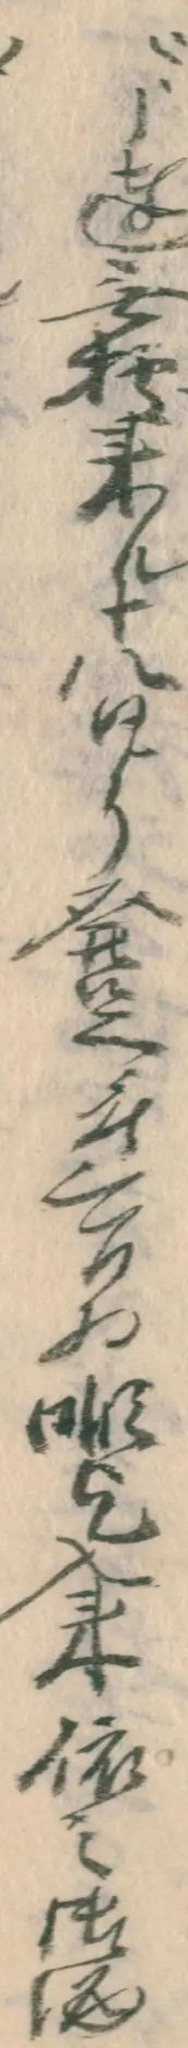被申達無拠来ル十八日より発足ニ付今日為暇乞入来依之御酒
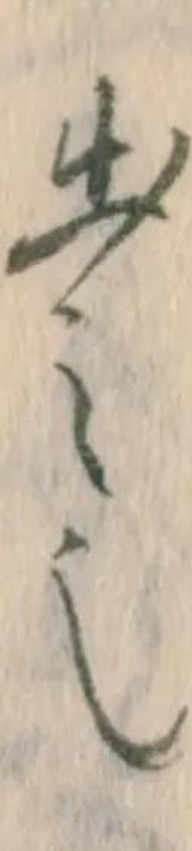出之也
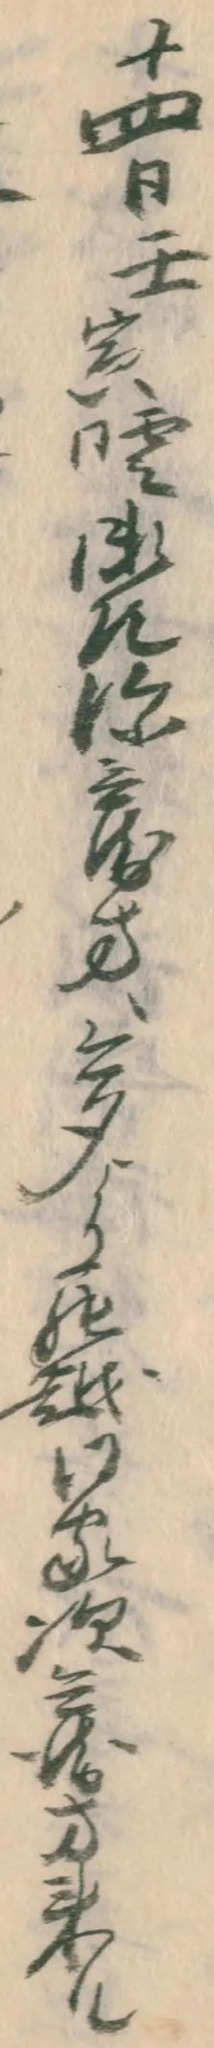十四日壬寅曇瀬尾弥兵衛方へ今夕より罷越同家次兵衛方来ル
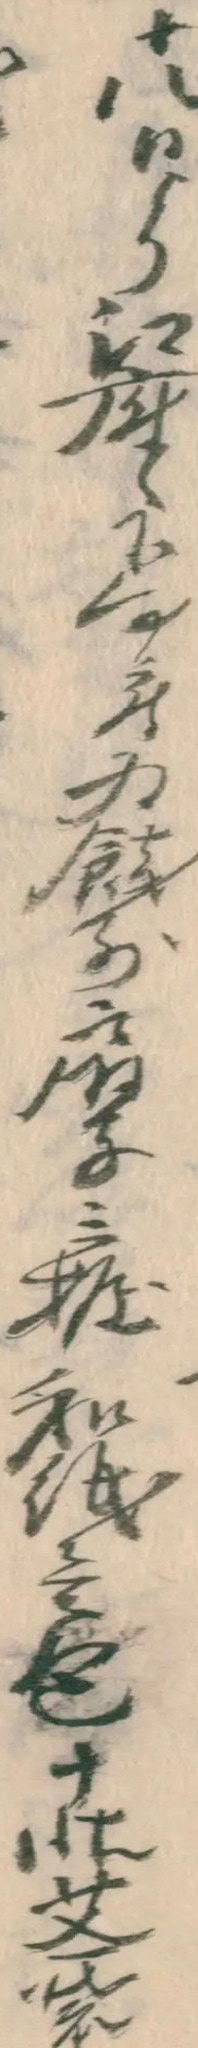十八日より江府へ下向ニ付為餞別扇子三握和紙壱包十帖艾袋
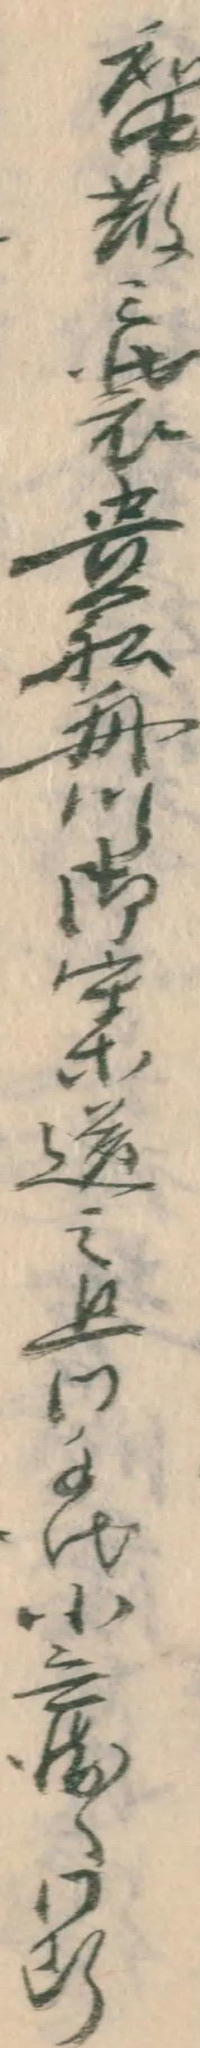和中散之袋貴舩舟川御守等送之且同手代小兵衛へ同断
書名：賀茂社記録. 第67冊
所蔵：国立国会図書館 National Diet Library, JAPAN
